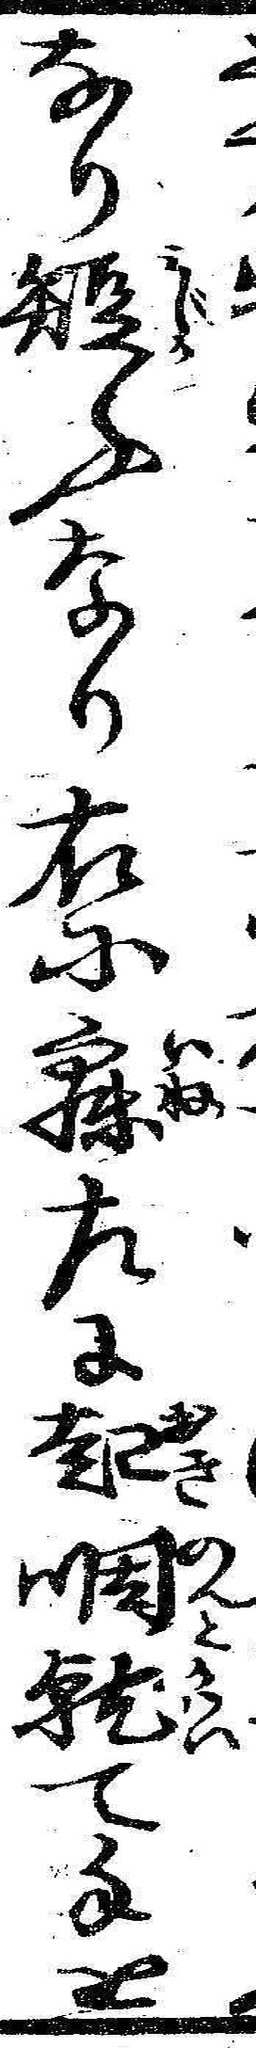なり短ふなり右に寝左に起咽乾て手を
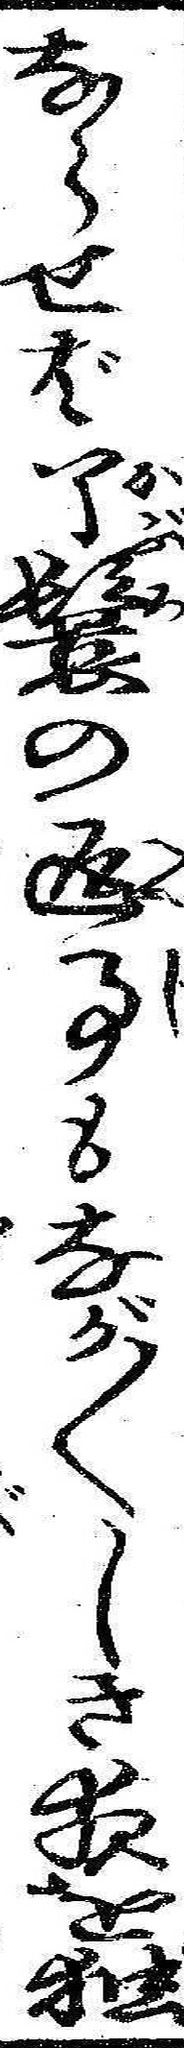ならせば了鬟の返事もなが〱しき夜を独
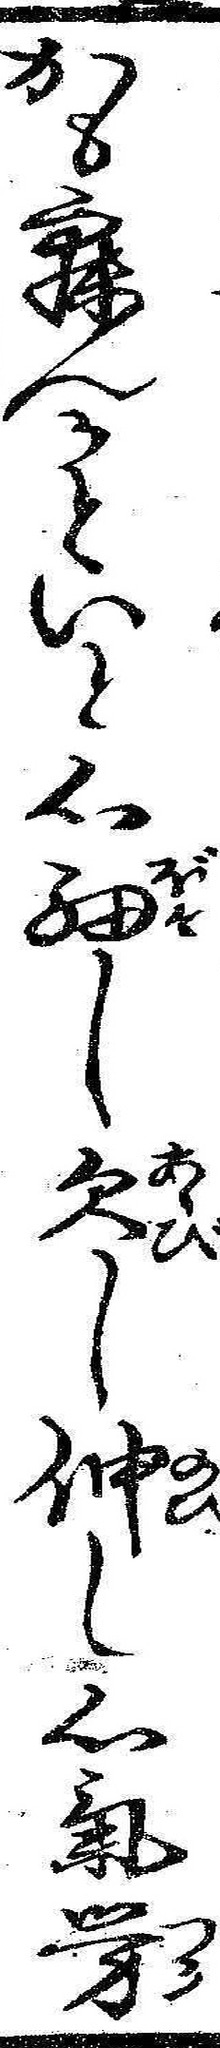かも寐んかといと心細し欠し伸し心気労
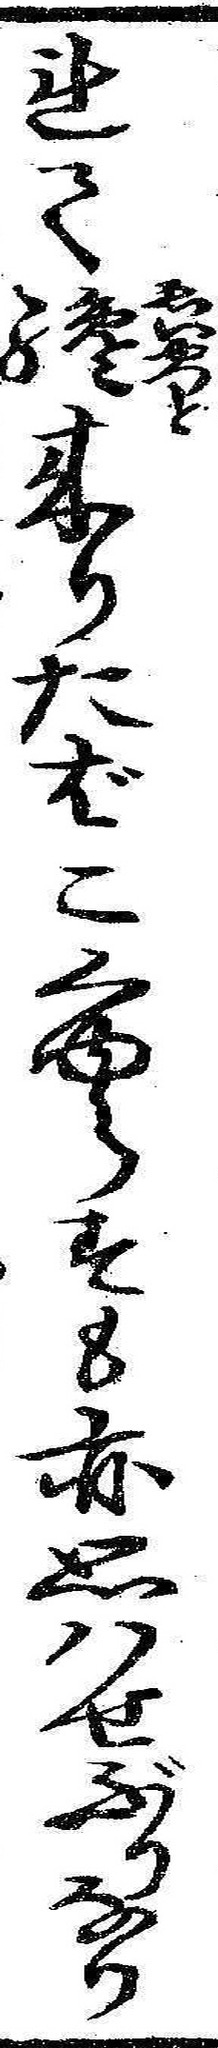れて纔来りたばこくゆらすも亦思はせぶりなり
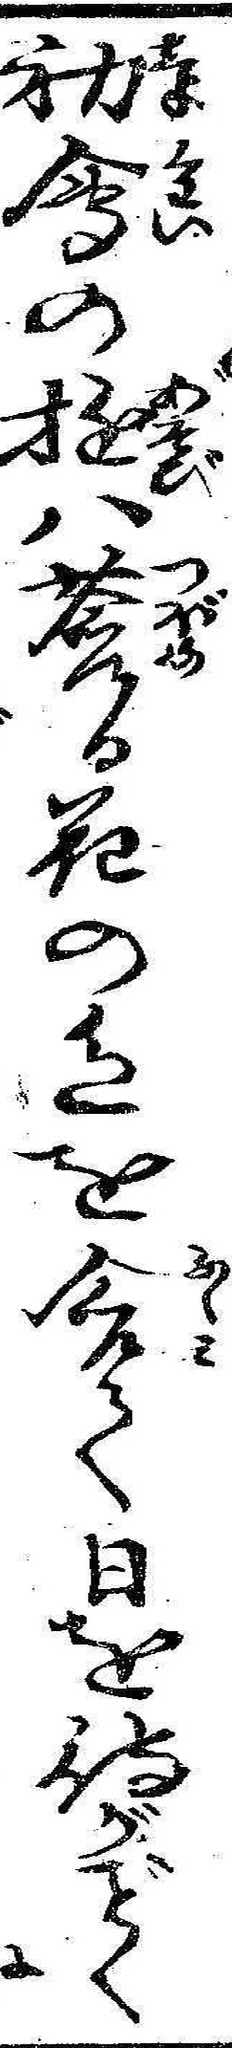初会の遊は莟ける花の色を含て日を待つがごとく
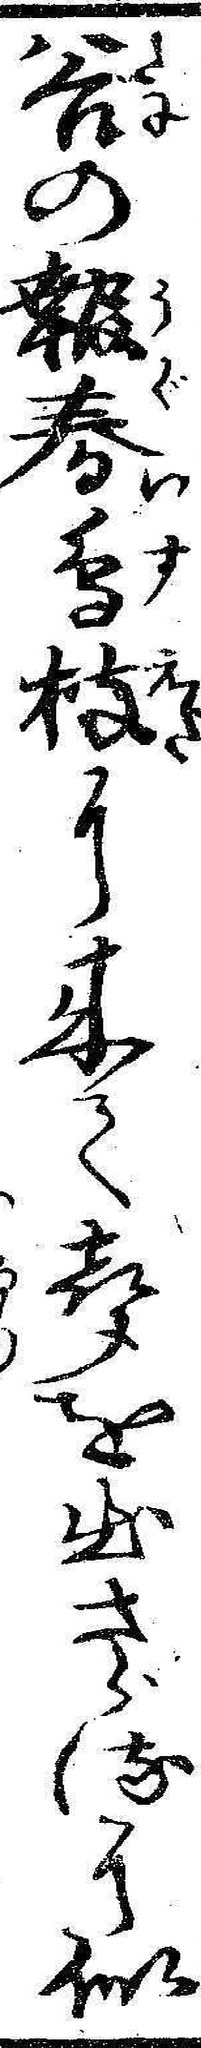谷の報春鳥枝に来て声を出さらるに似
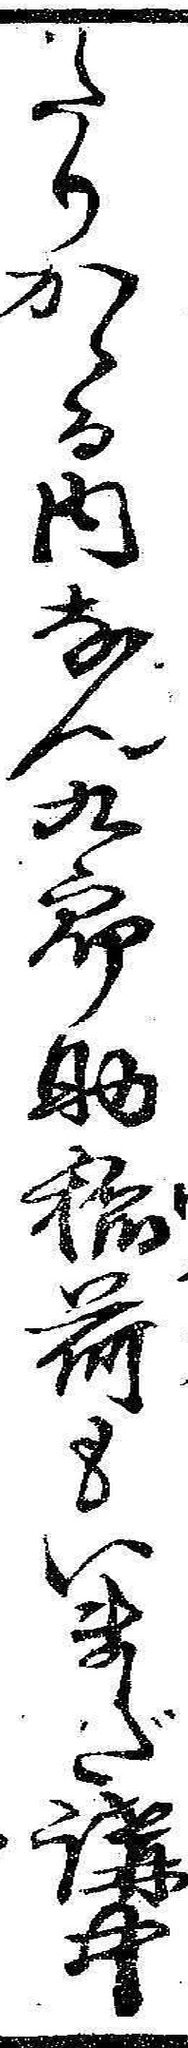たりかゝる内なん九郎助稲荷もいまだ講中
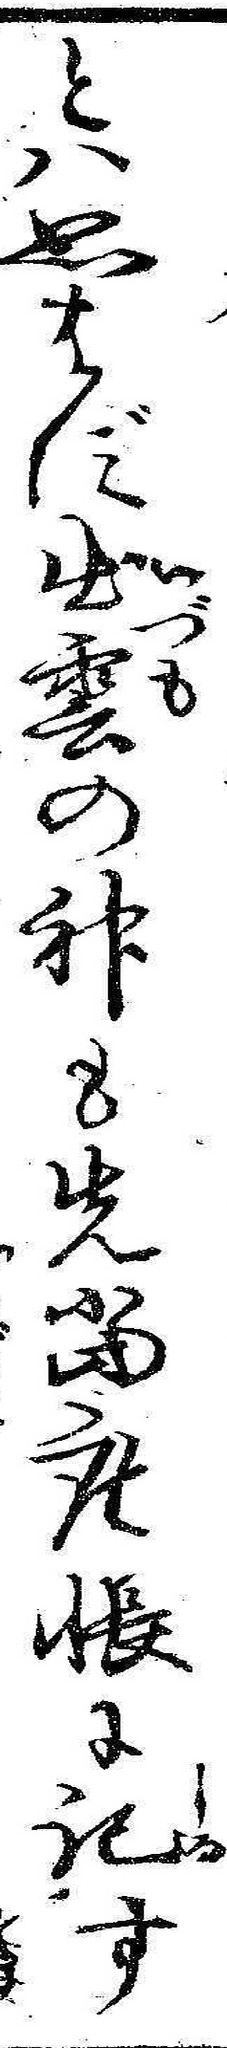とは思はず出雲の神も先当座帳に記す
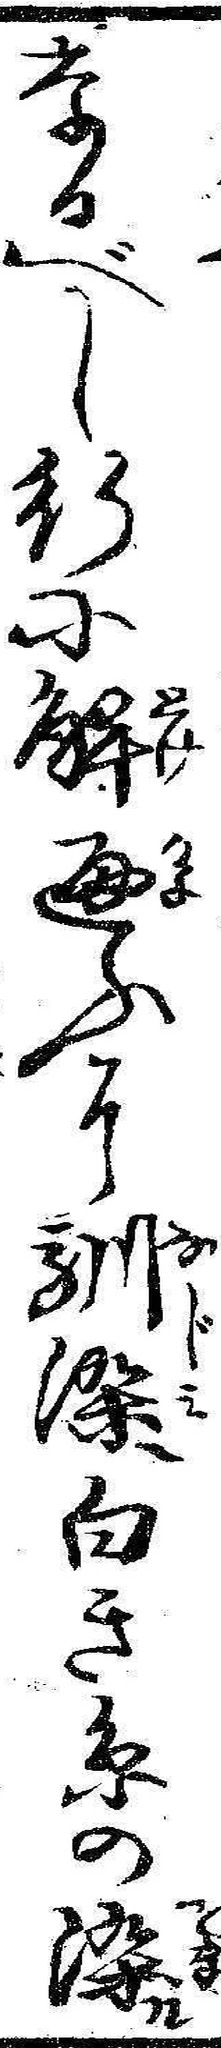なるべし行に解通ふに馴染白き糸の染
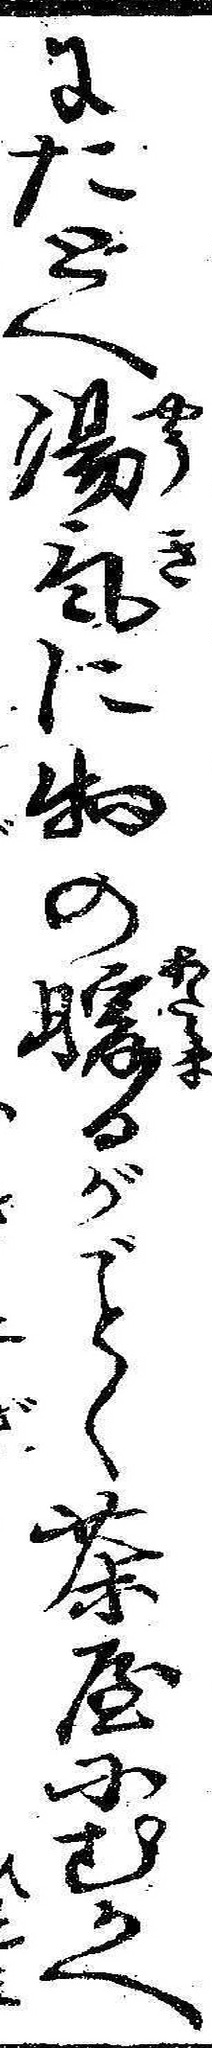にたとへ陽気に物の暖るがごとく茶屋にむかへ
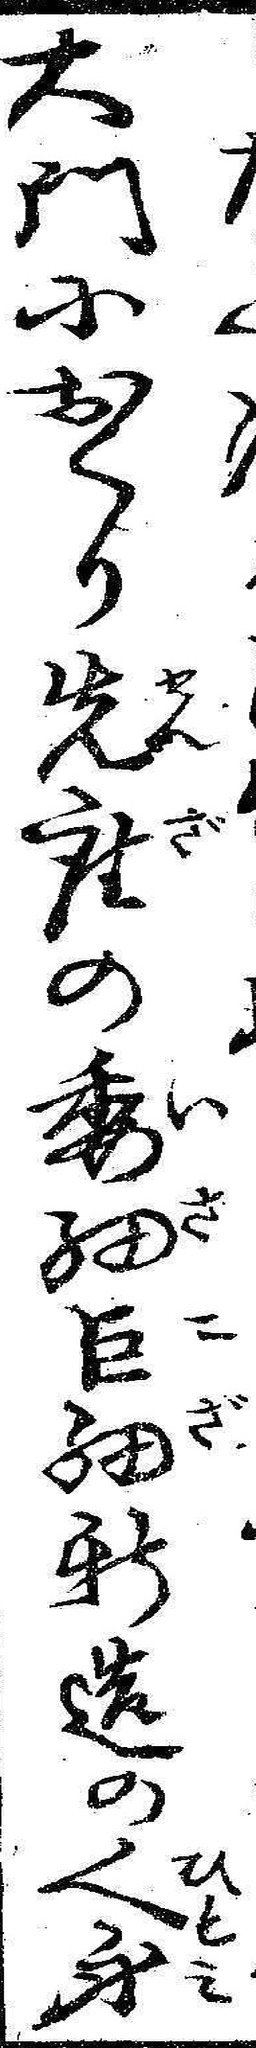大門におくり先座の委細臣細新造の人身

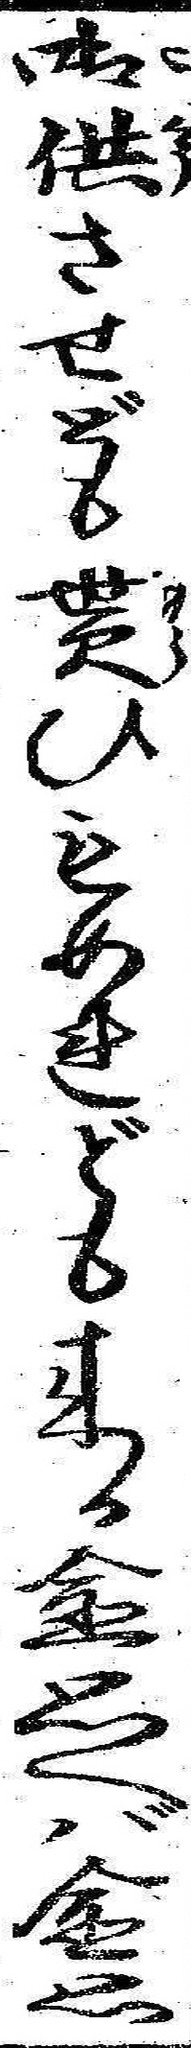御供させども貰ひもめれども来る愈思へば愈思
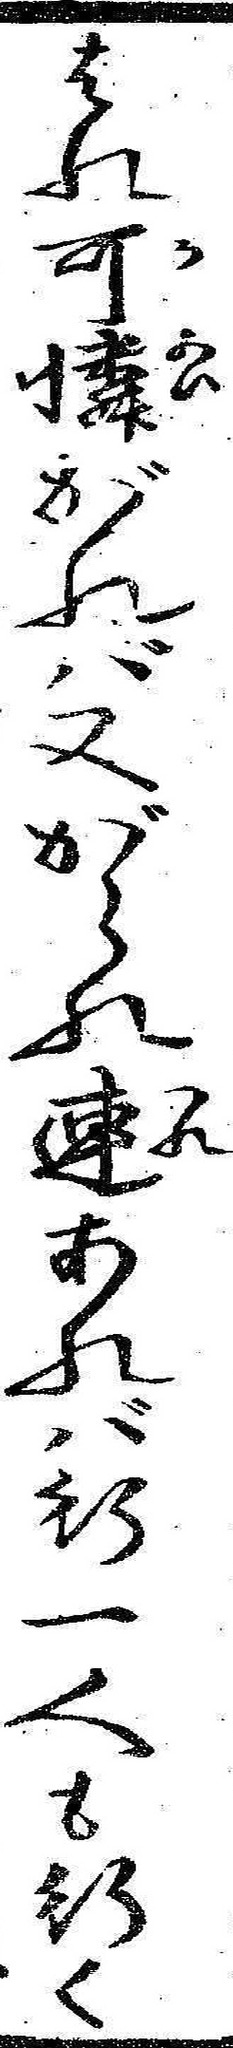はれ可憐がれば又がられ連あれば行一人も行く
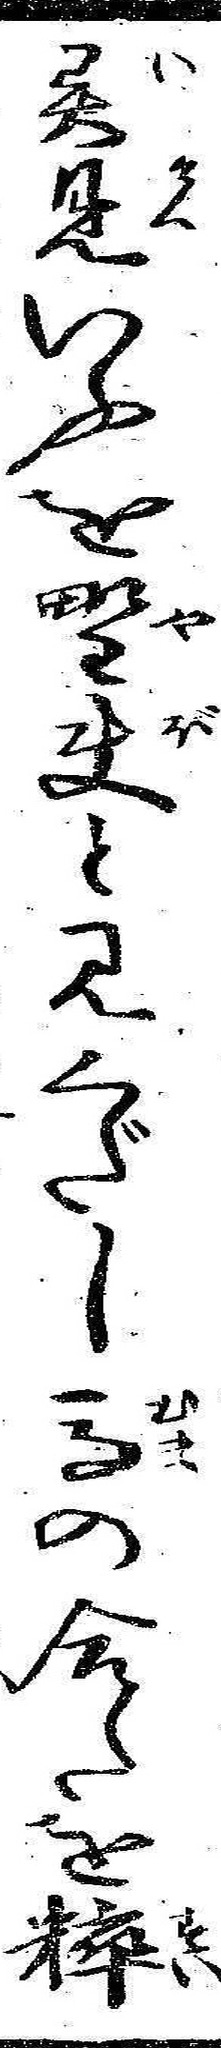異見いふを野夫と見くだし馬の合たを粋
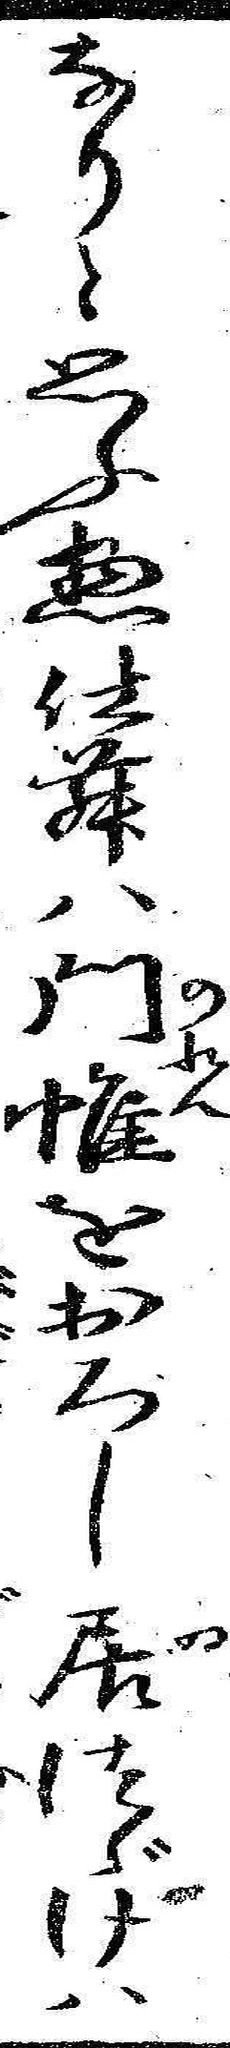なりと思ふ惣仕舞は門帷をおろし居つゞけは
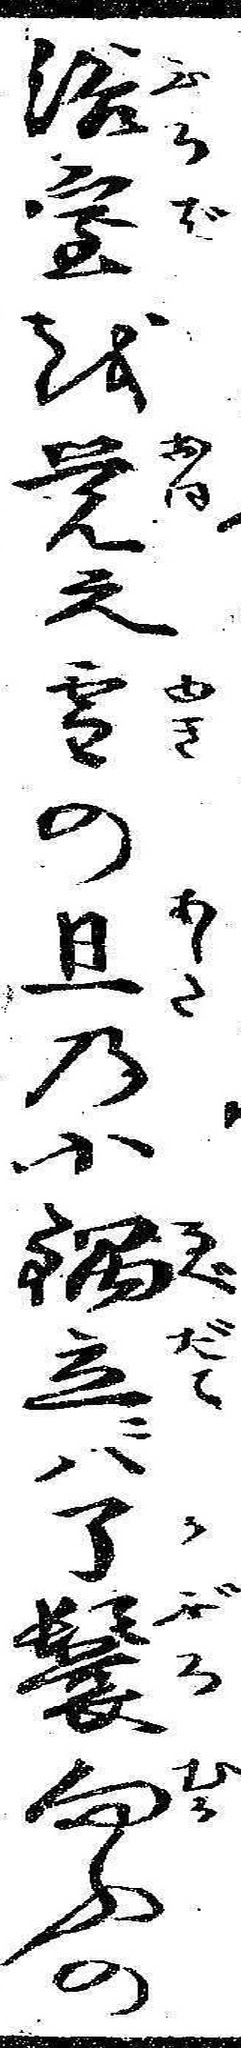浴室を覚え雪の旦の小鍋立了鬟向ふの
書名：根無草後編
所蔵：国文学研究資料館
